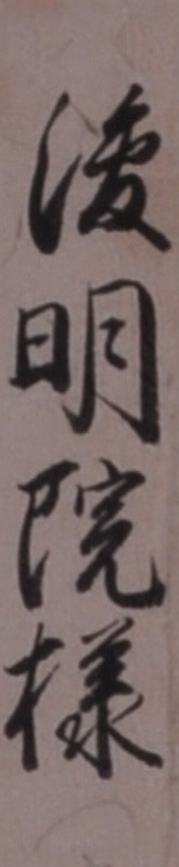浚明院様
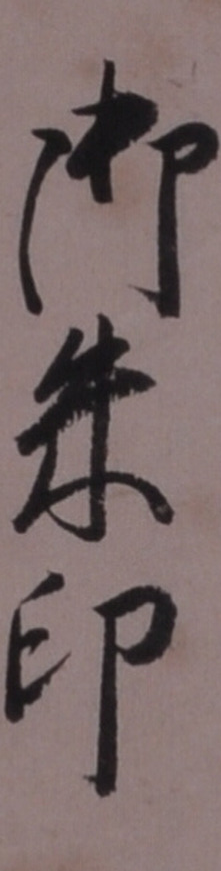御朱印
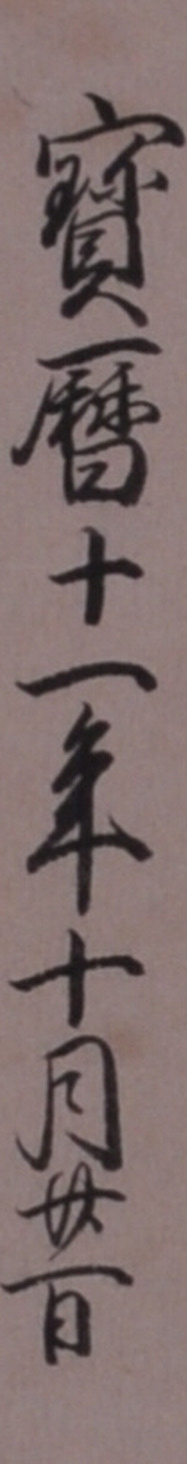宝暦十一年十月廿一日
